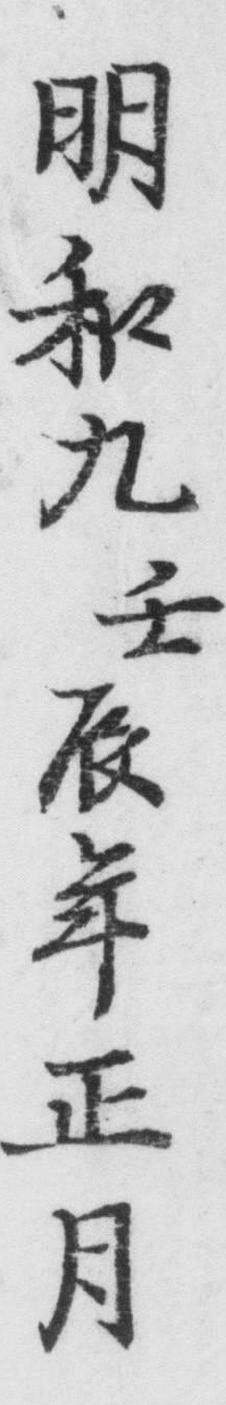明和九壬辰年正月
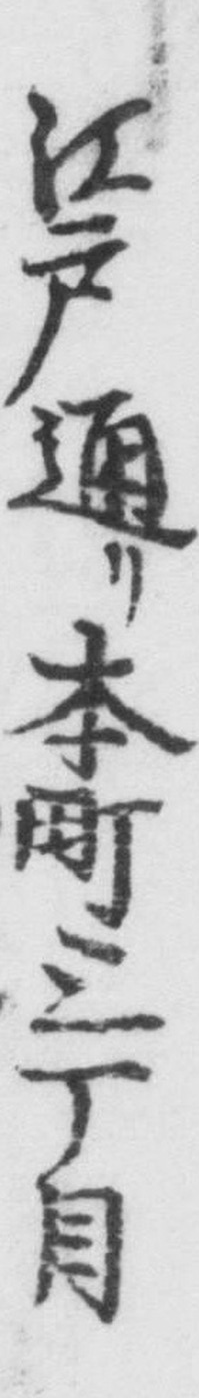江戸通り本町三丁目
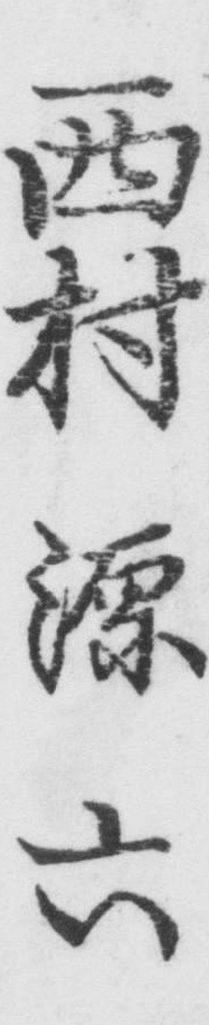西村源六
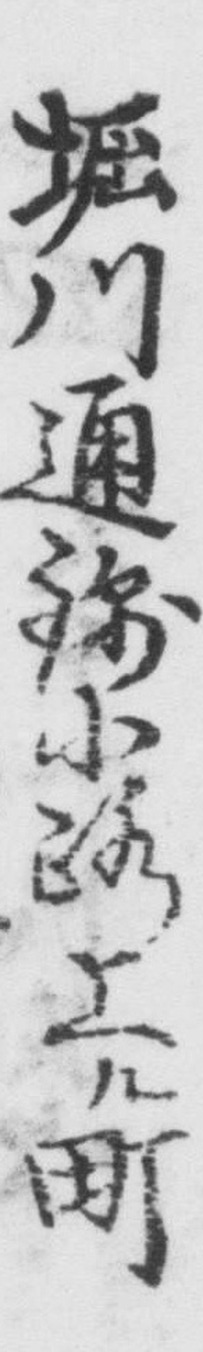堀川通錦小路上ル町
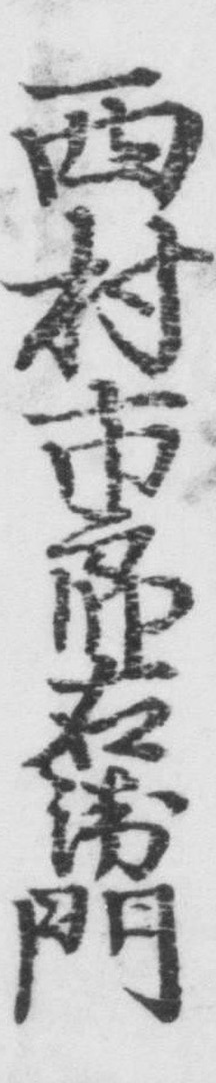西村市郎右衛門
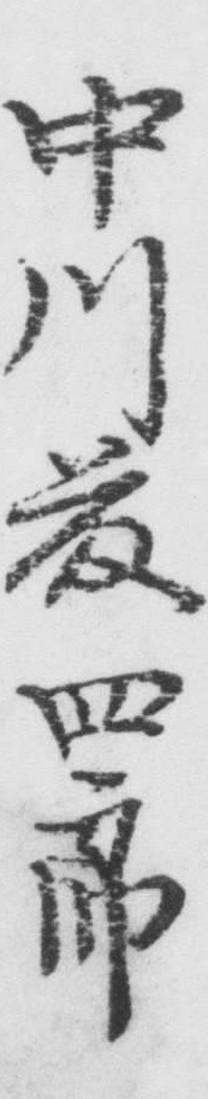中川藤四郎
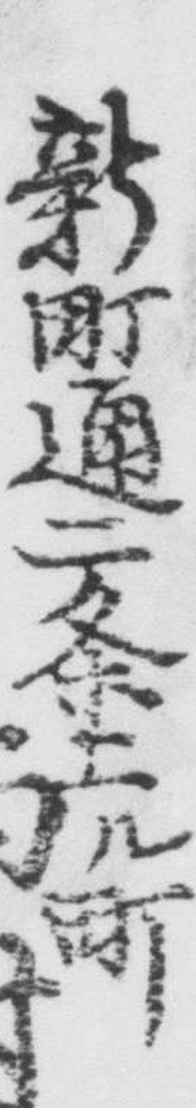新町通二条上ル町
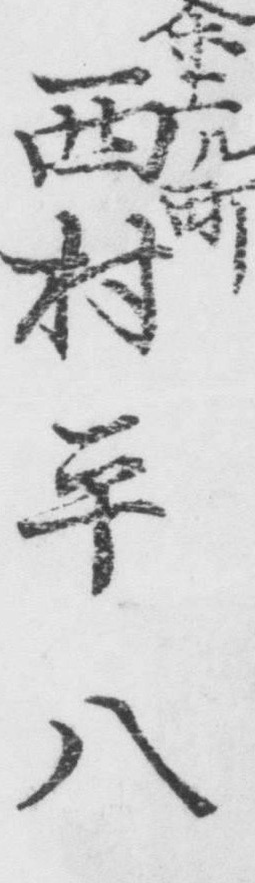西村平八
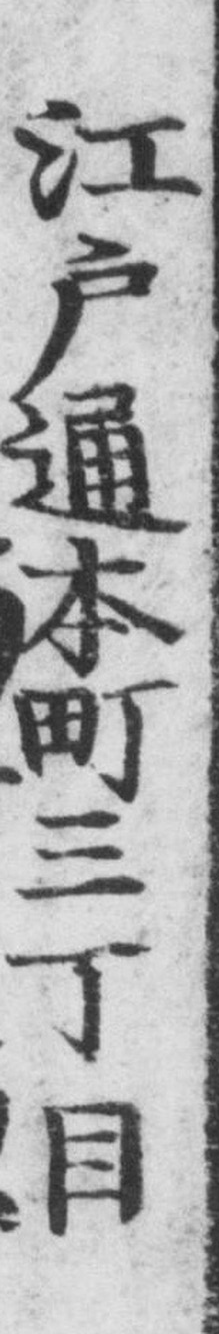江戸通り本町三丁目
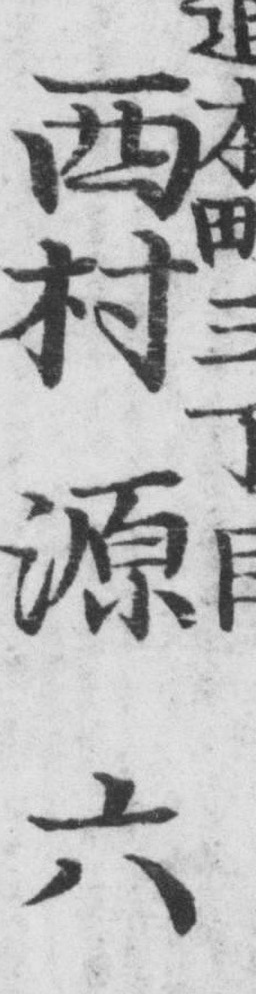西村源六
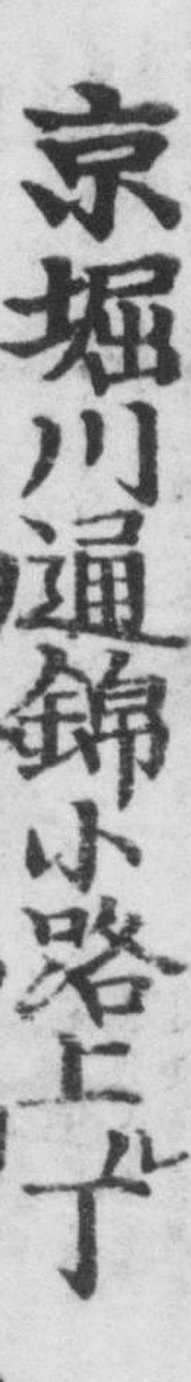堀川通錦小路上ル町
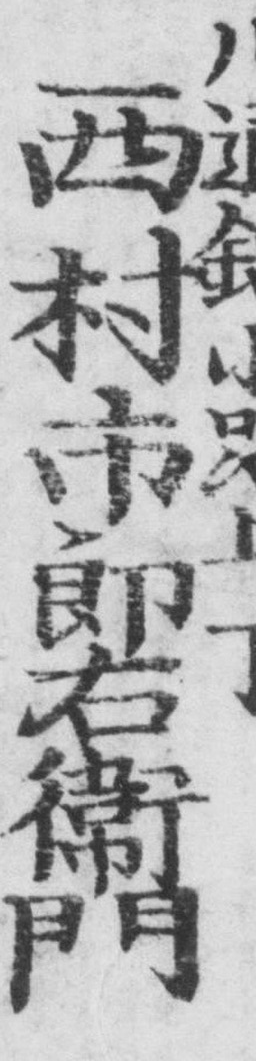西村市郎右衛門
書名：普茶料理抄
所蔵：大阪府立大学学術情報センター 国文学研究資料館
